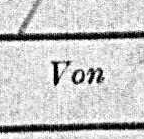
Von
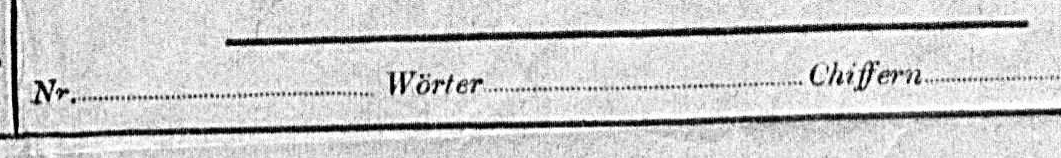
Nr. ..................Wörter .......................Chiffern...............
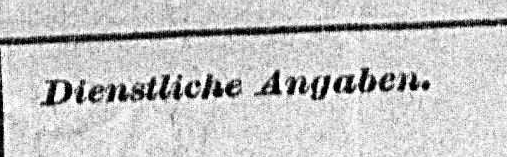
Dienstliche Angaben
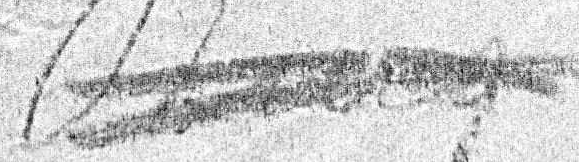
Xx
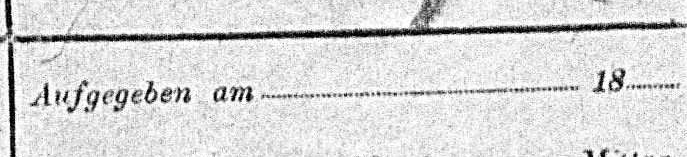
Aufgegeben am ......................... 18 ........
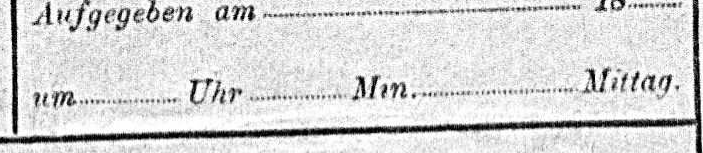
um ............Uhr ................ Min. .......Mittag.
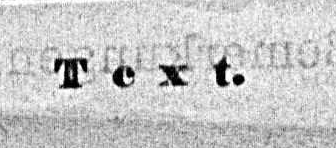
Text.
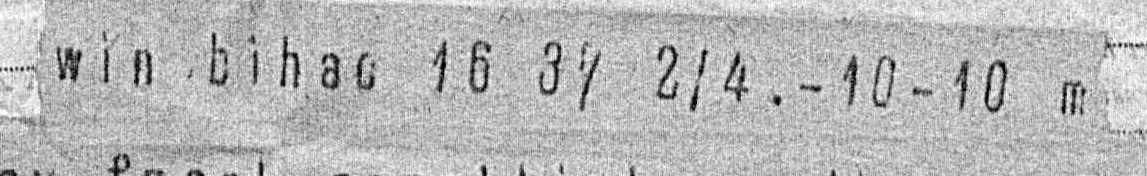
win bihac 16 37 2/4.-10-10 m
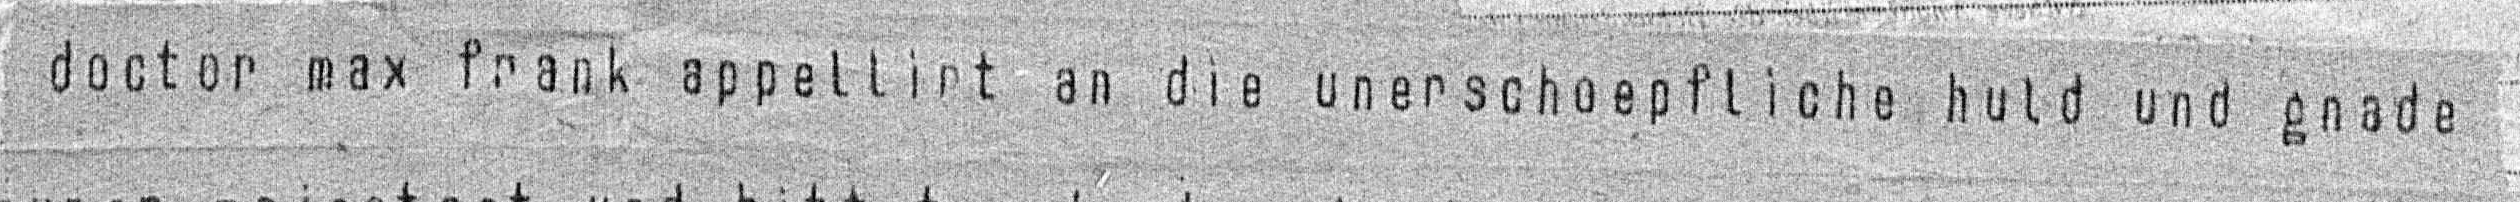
doctor max frank appellirt an die unerschoepfliche huld und gnade
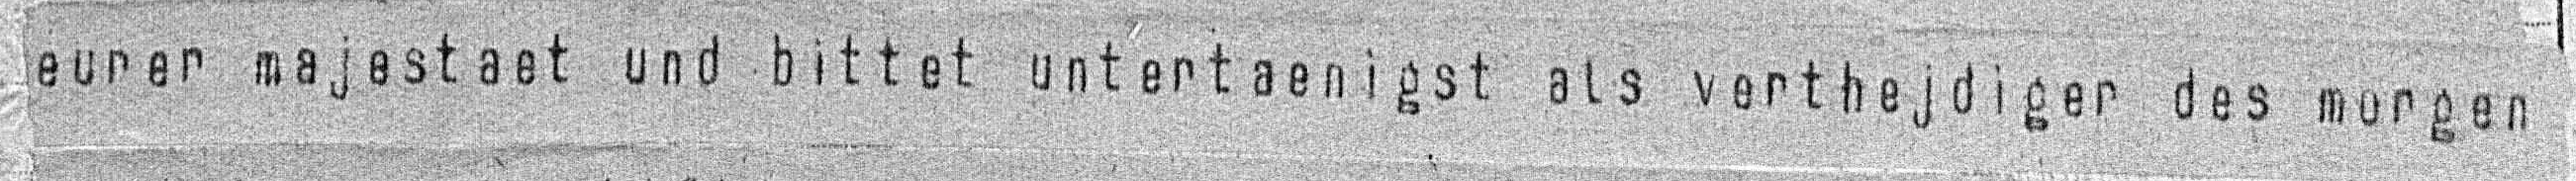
eurer majestaet und bittet untertaenigst als vertheidiger des morgen
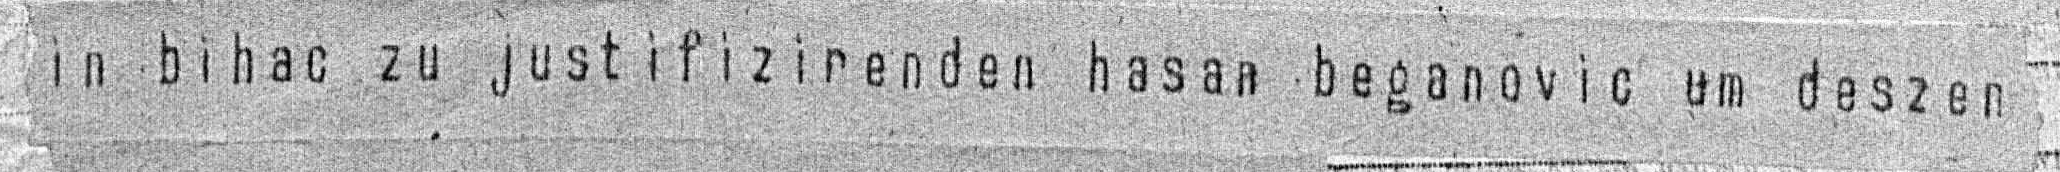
in bihac zu justifizirenden hasan beganovic um deszen
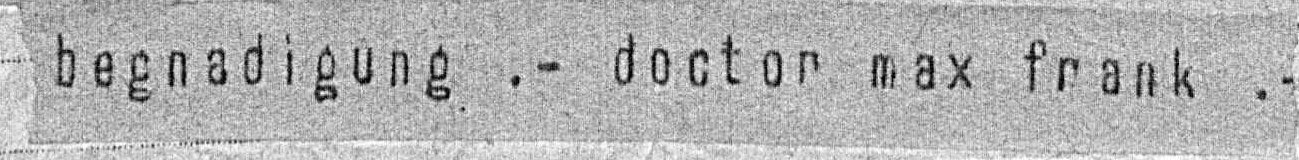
begnadigung .- doctor max frank .
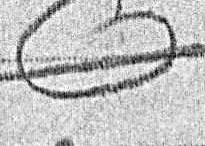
xx
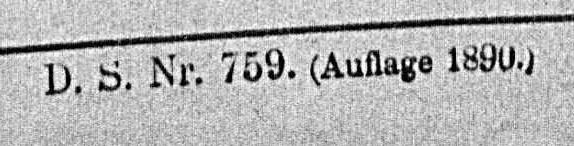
D. S. Nr. 759. (Auflage 1890.)
